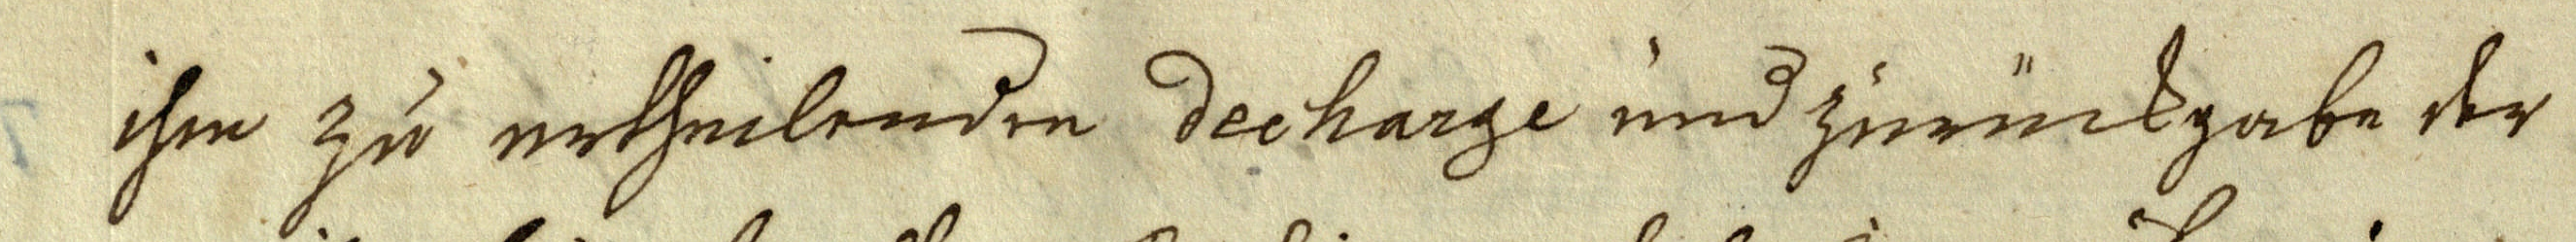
ihm zu ertheilenden decharge und Zurückgabe der
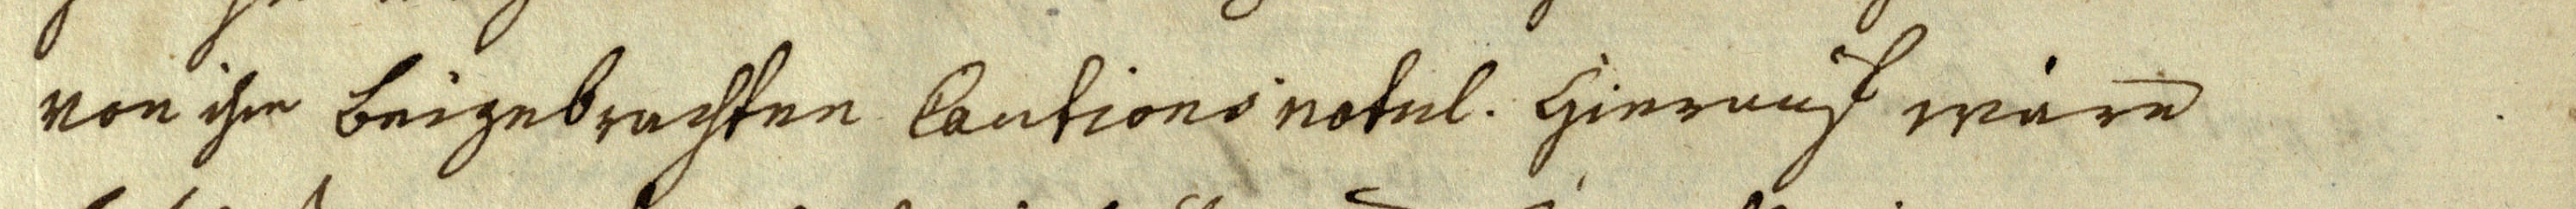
von ihm beigebrachten Cautionsnotul. Hierauf wäre
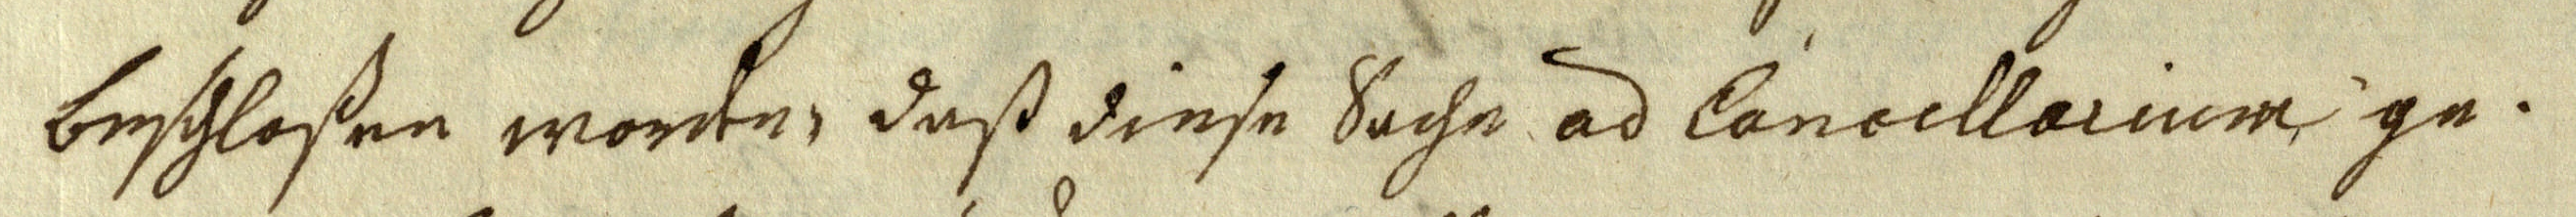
beschloßen worden, daß diese Sache ad Cancellarium ge¬
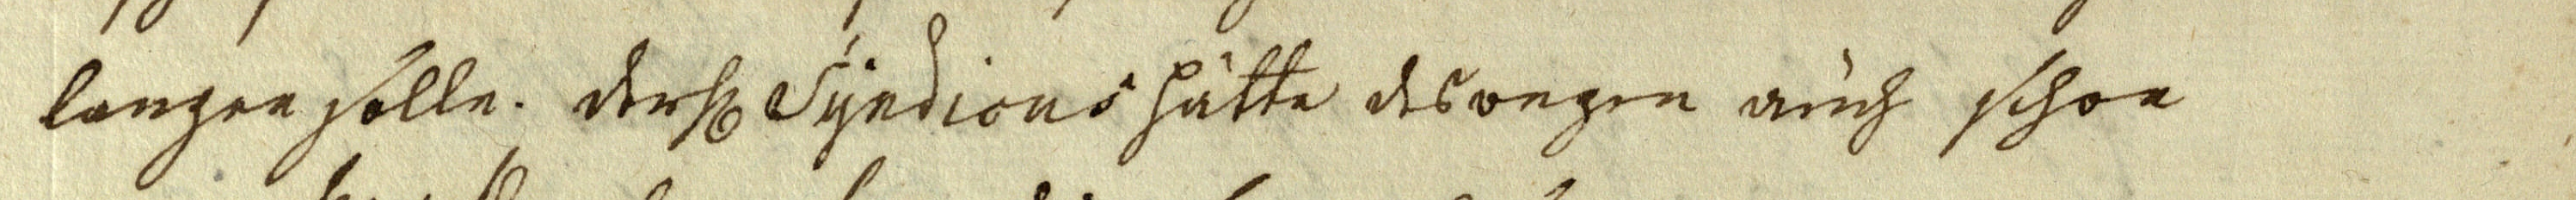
langen solle. DerH. Sÿndicus hätte deswegen auch schon
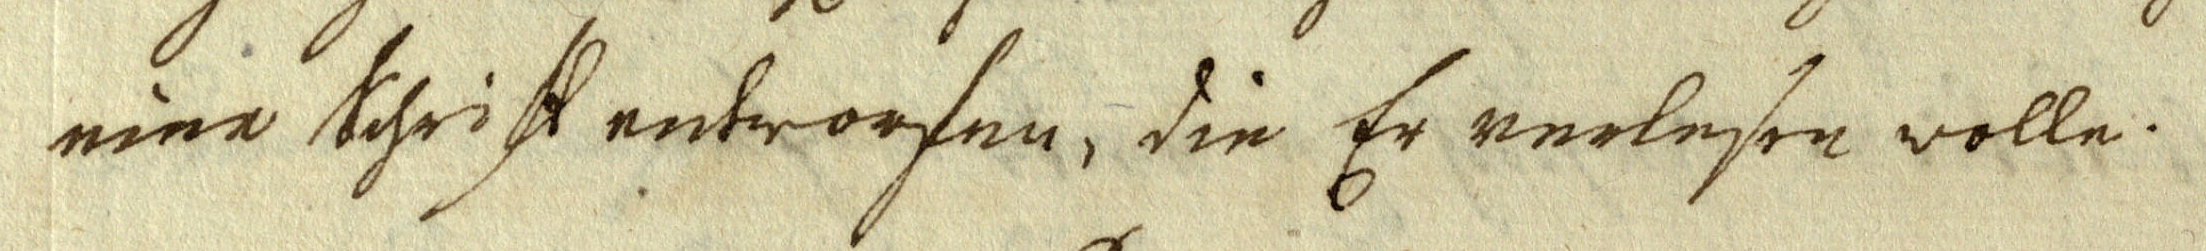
eine Schrift entworfen, die Er verlesen wolle.
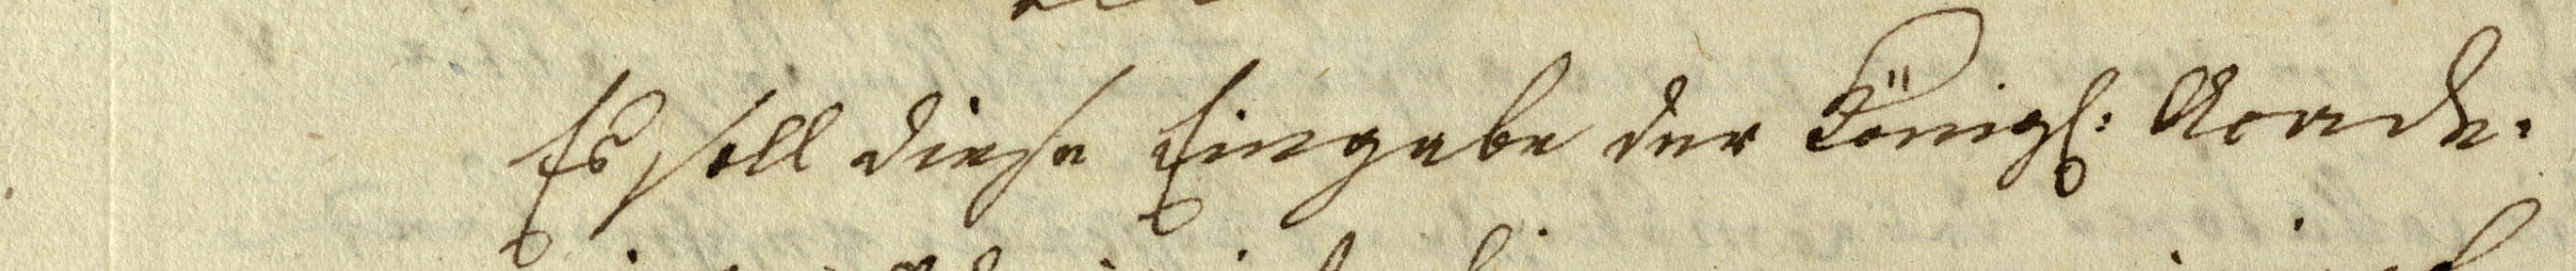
Es soll diese Eingabe der Königl. Acade¬
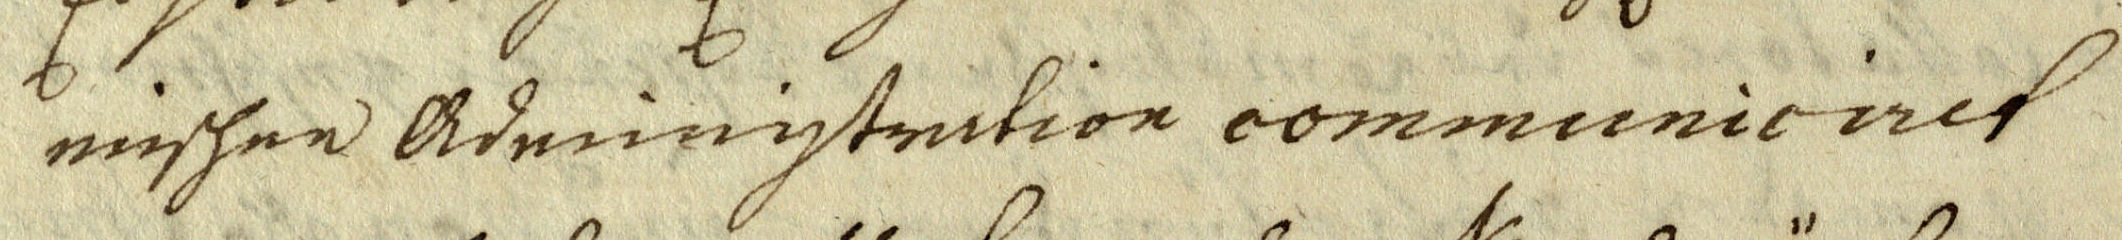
mischen Administration communiciret
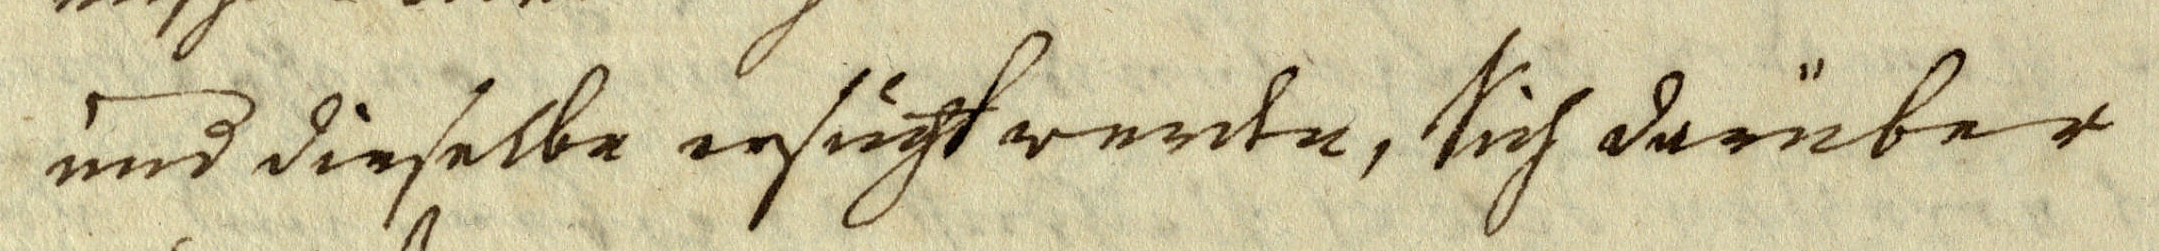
und dieselbe ersucht werden, Sich darüber
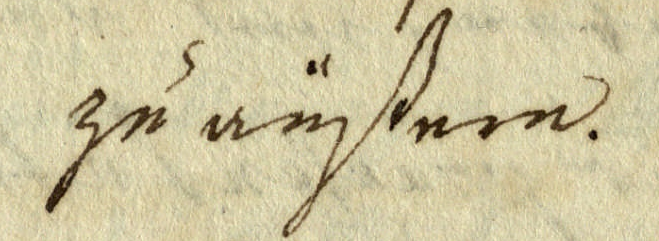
zu äußern.
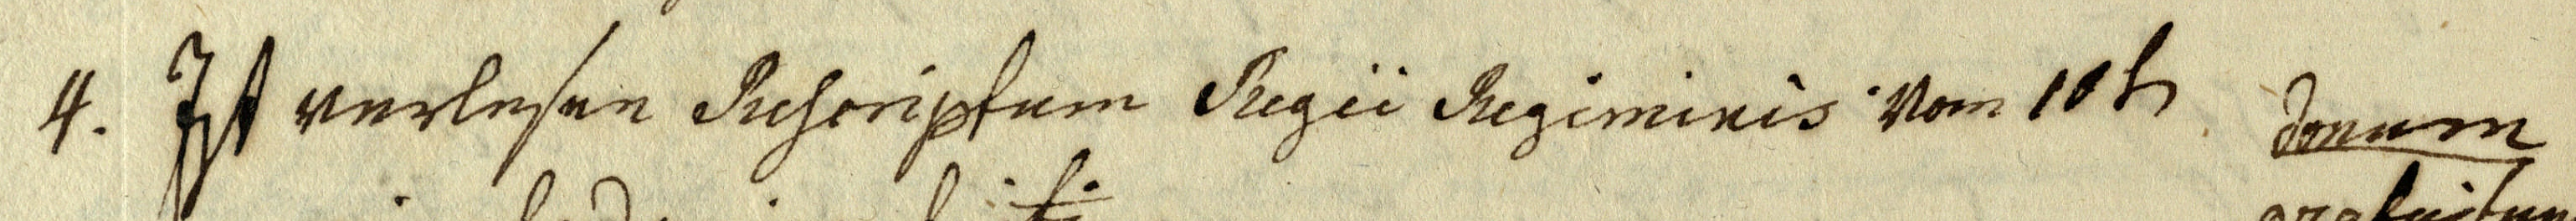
4. Ist verlesen Rescriptum Regii Regiminis vom 10t donum
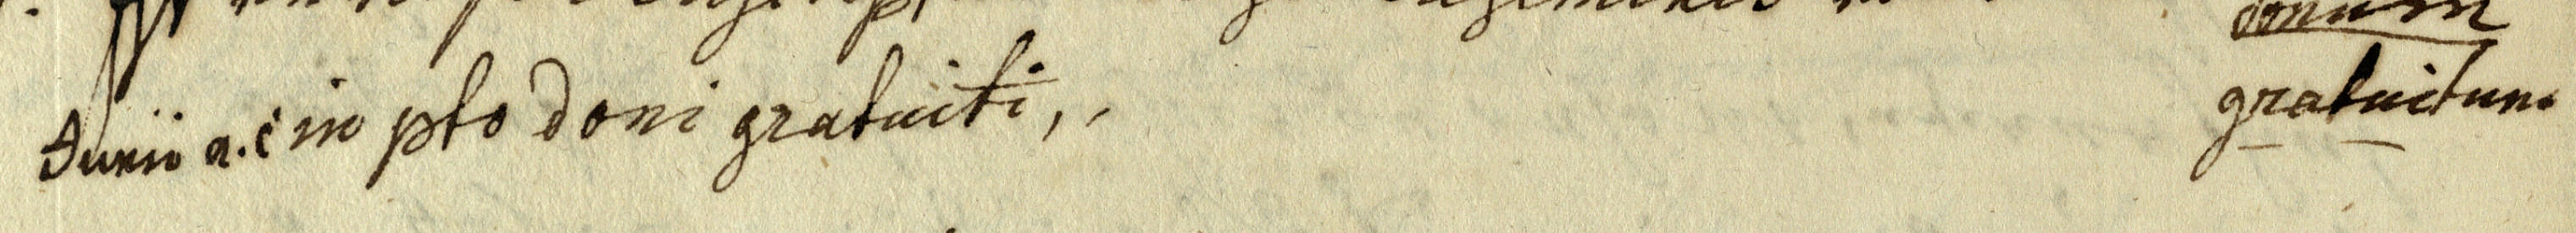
Junii a. c. in pto doni gratuiti, gratuitun
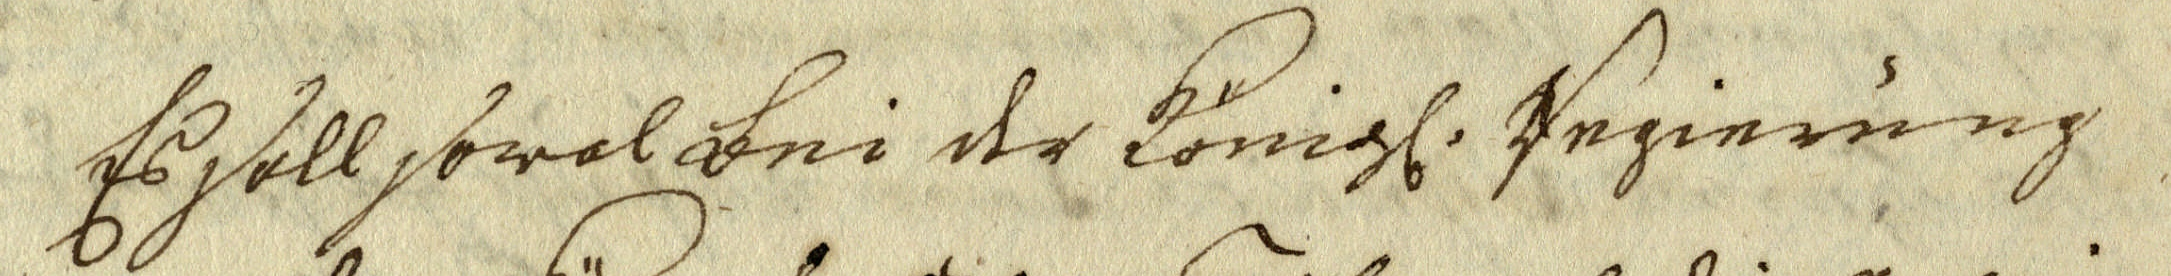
Es soll sowol bei der Königl. Regierung
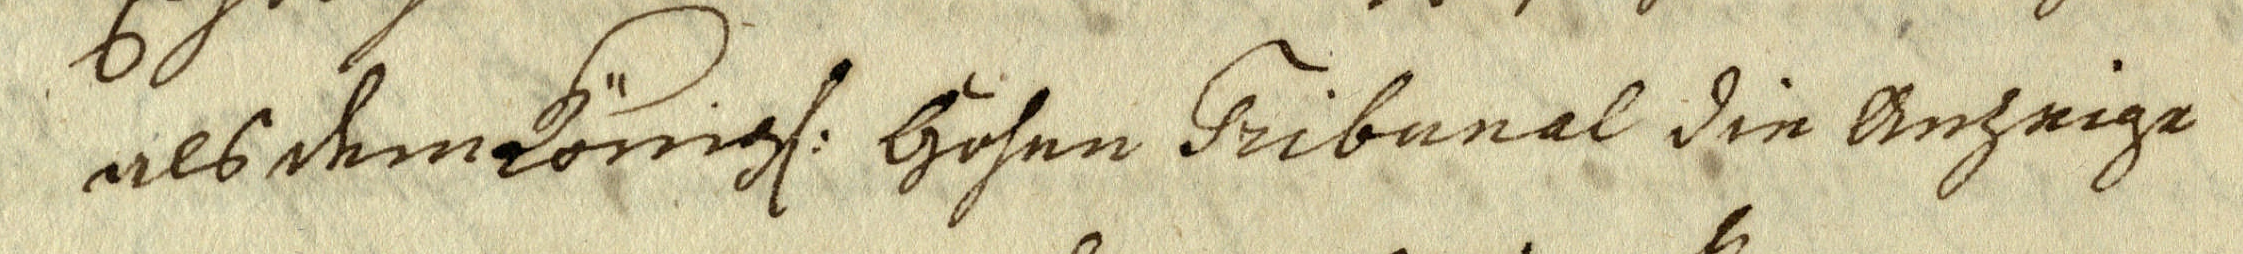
als dem Königl. Hohen Tribunal die Anzeige
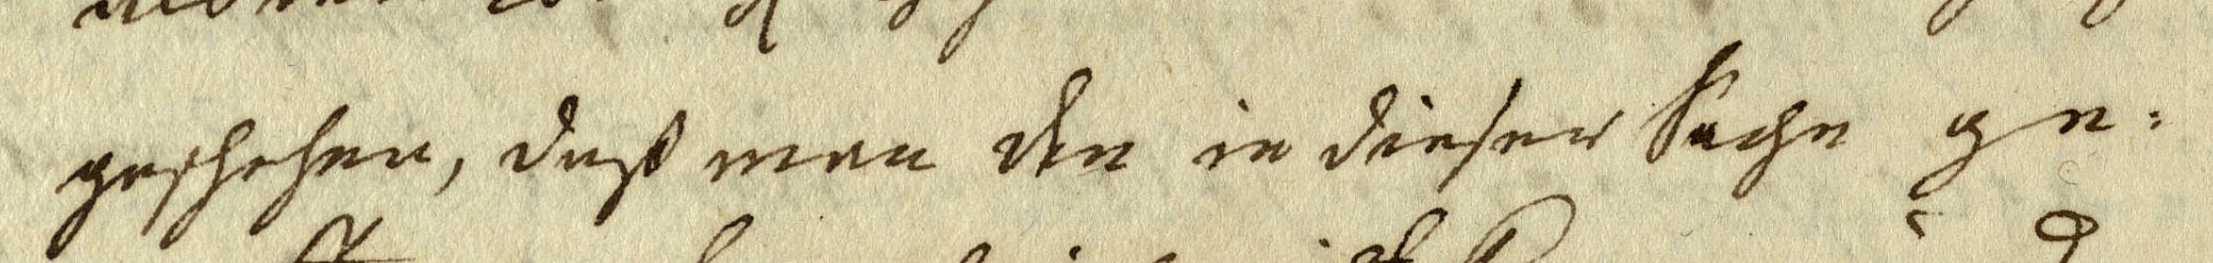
geschehen, daß man den in dieser Sache ge¬
